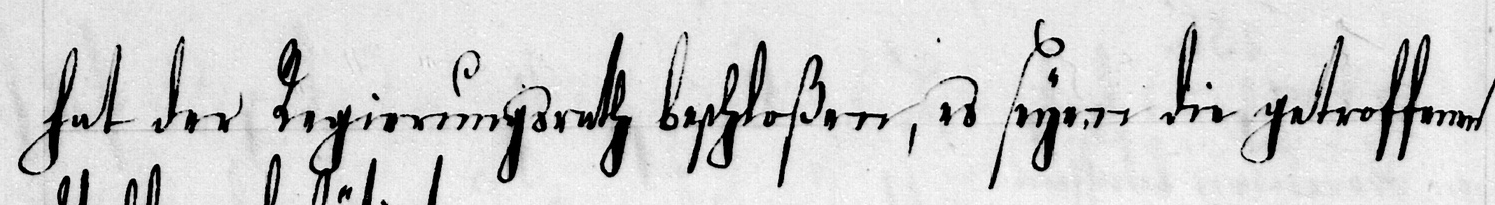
hat der Regierungsrath beschloßen, es seyen die getroffe¬
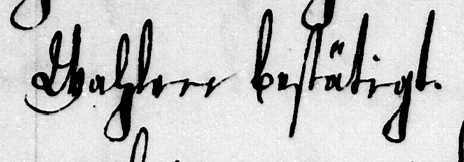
Wahlen bestätigt.
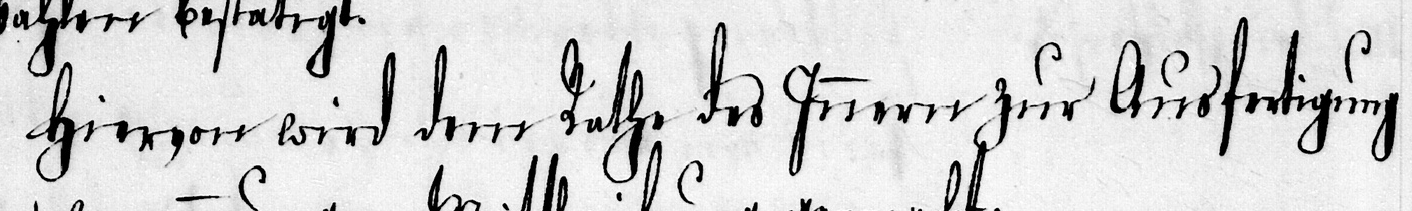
Hiervon wird dem Rathe des Innern zur Ausfertigung
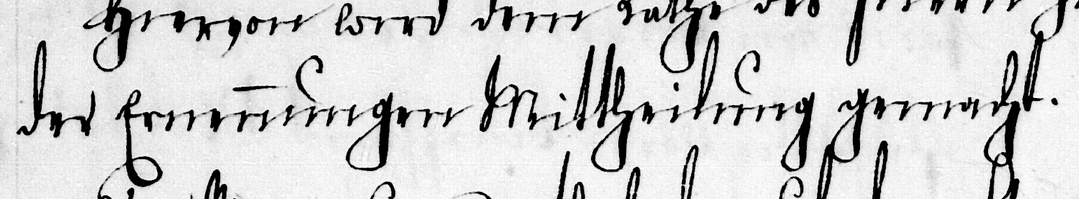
der Ernennungen Mittheilung gemacht.
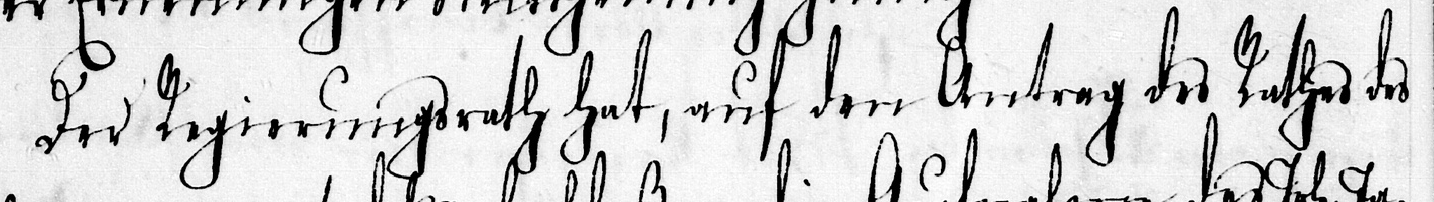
Der Regierungsrath hat, auf den Antrag des Rathes
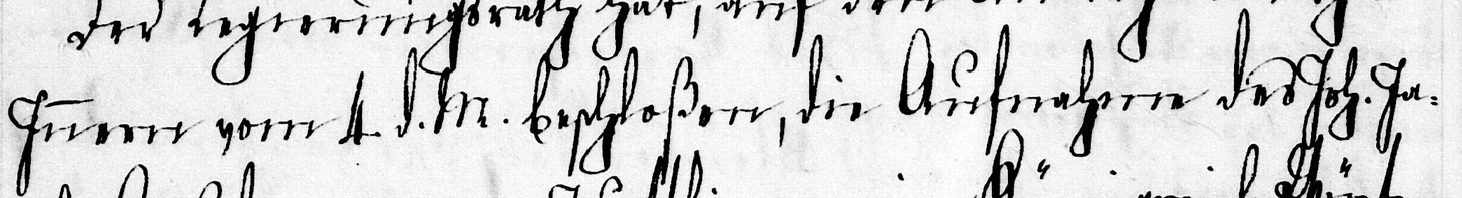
Innern vom 4. d. M. beschloßen, die Aufnahme des Joh. Ja¬
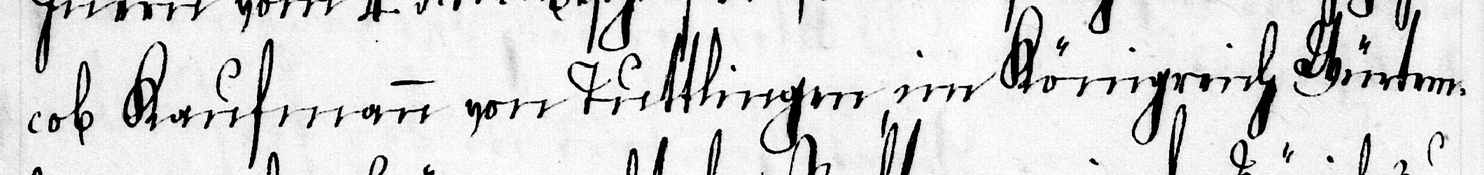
cob Kaufmann von Tuttlingen im Königreich Würtem¬
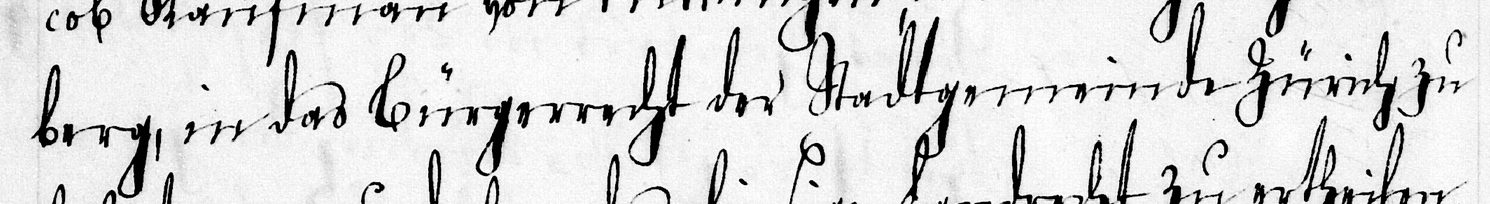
berg, in das Bürgerrecht der Stadtgemeinde Zürich zu
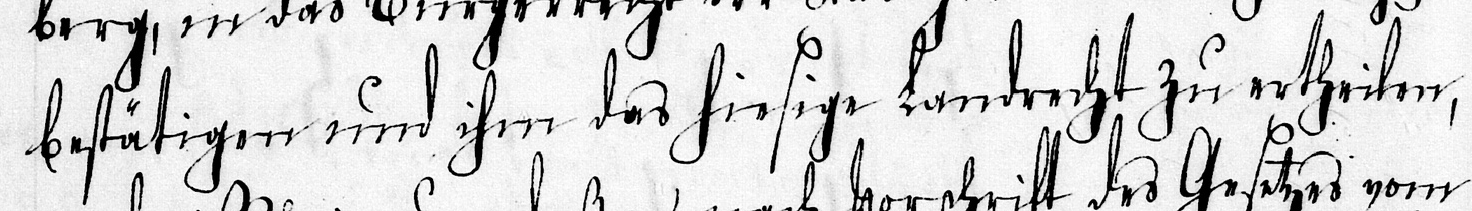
bestätigen und ihm das hiesige Landrecht zu ertheilen,
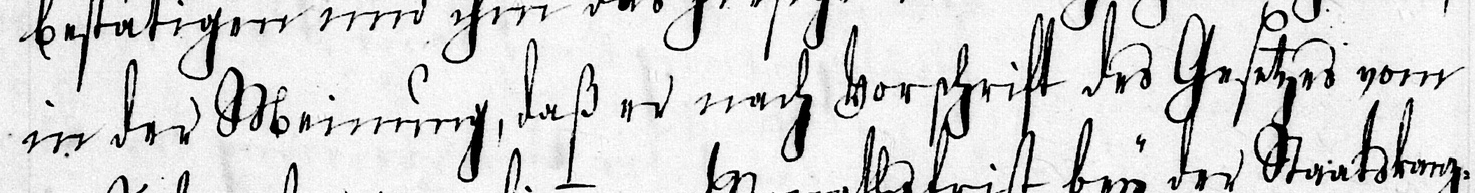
in der Meinung, daß er nach Vorschrift des Gesetzes vom
